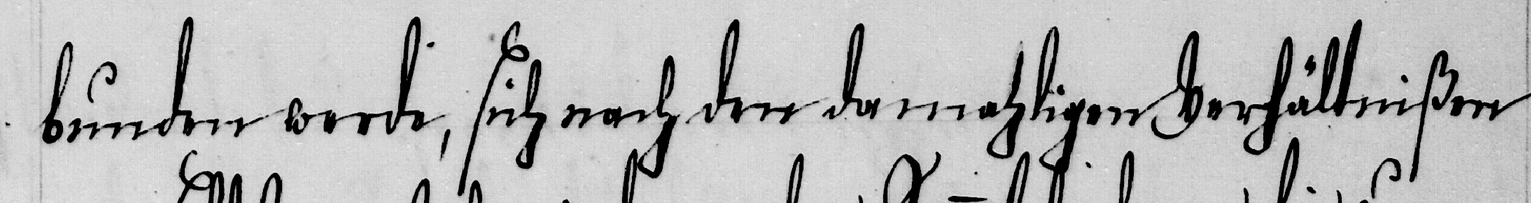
bunden werde, sich nach den damahligen Verhältnißen
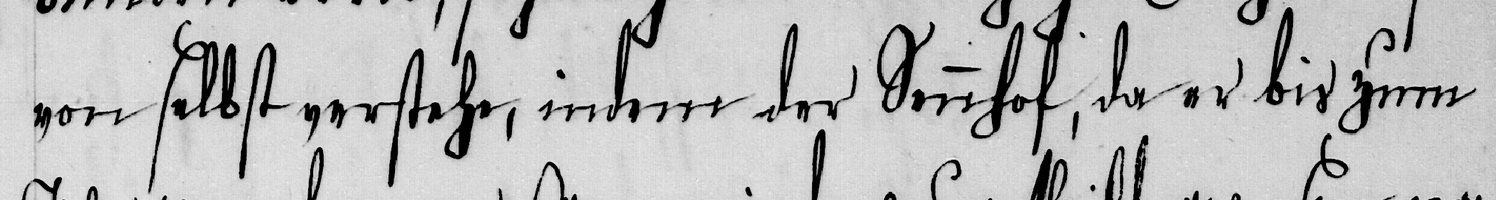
von selbst verstehe, indem der Sennhof, da er bis zum
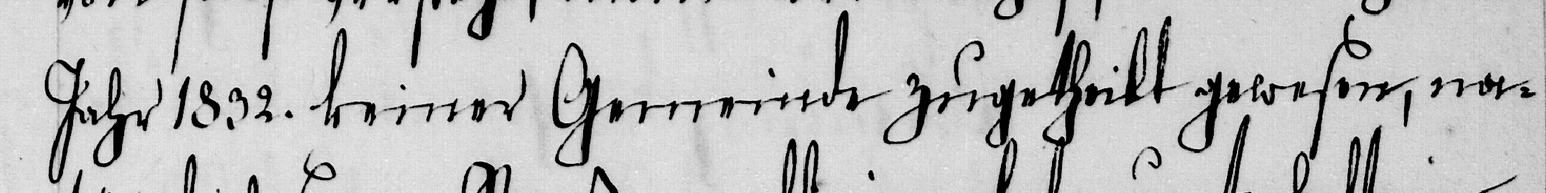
Jahr 1832. keiner Gemeinde zugetheilt gewesen, na¬
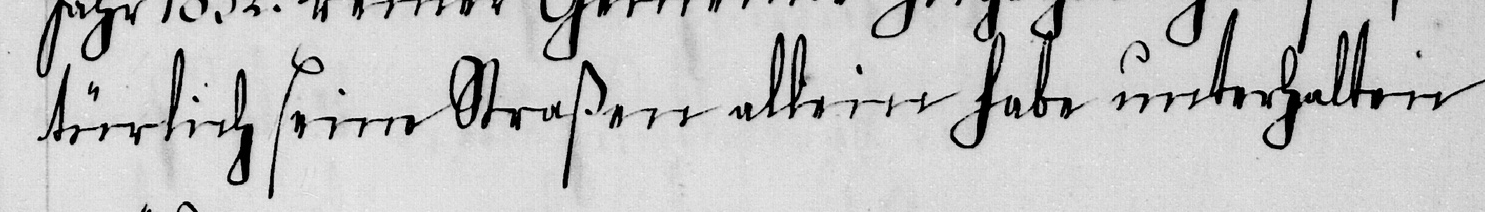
türlich seine Straßen alleine habe unterhalten
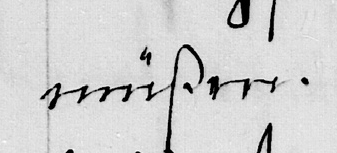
müßen.
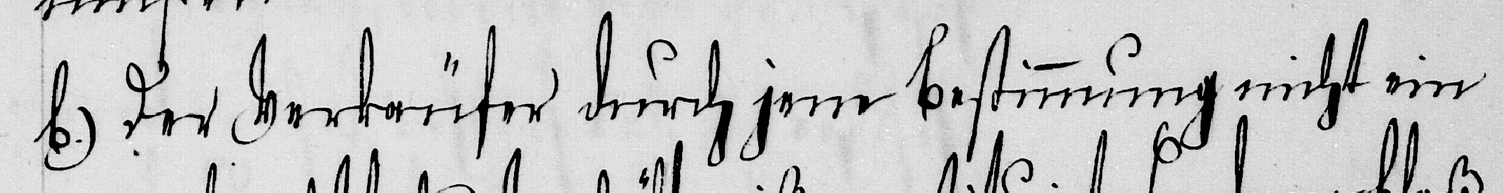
b.) Der Verkäufer durch jene Bestimmung nicht ein
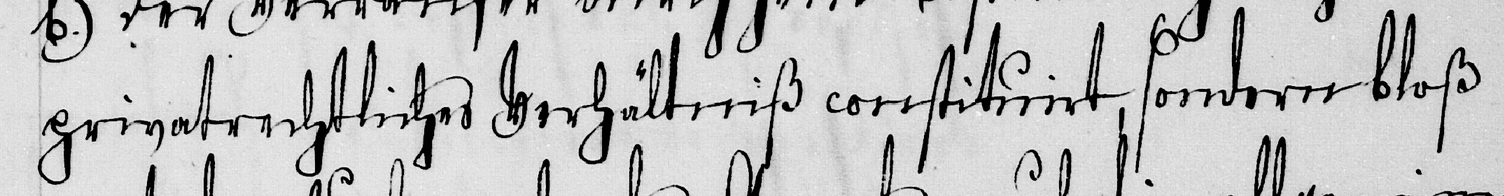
privatrechtliches Verhältniß constituirt, sondern bloß
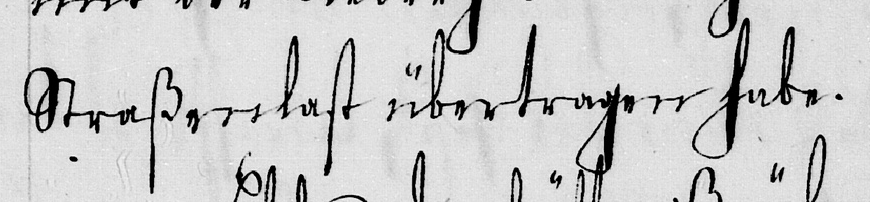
Straßenlast übertragen habe.
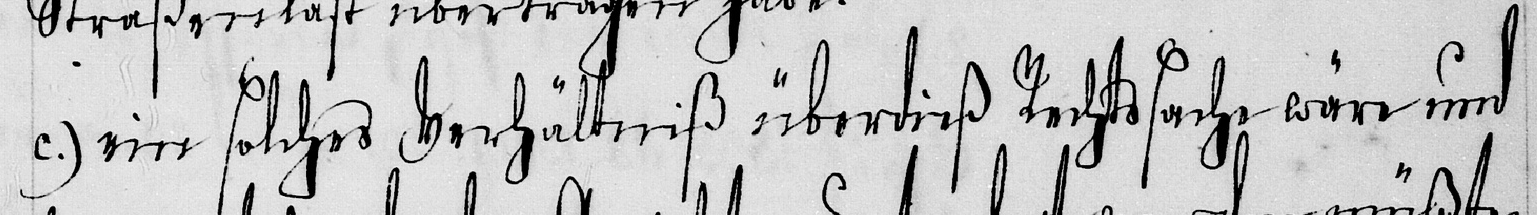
c.) ein solches Verhältniß überdieß Rechtssache wäre und
